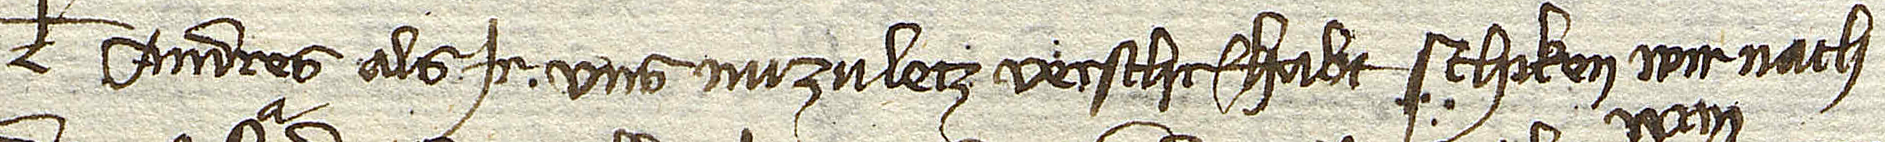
L* Andres als Ir vns nu ʒulecʒ verſchr* habt ſchiken wir nach
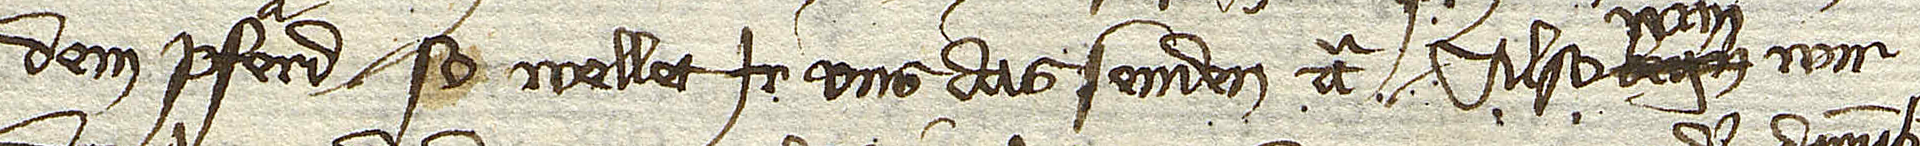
dem pfërd / ſo wellet Ir vns das ſenden ec* / Alſo beg*n wir
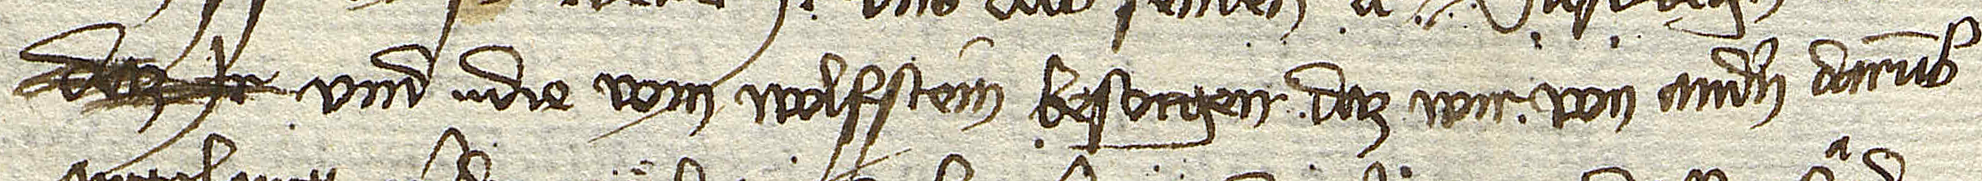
daʒ Ir vnd ~ die vom wolfſtein beſorgen daʒ wir von and*n daru*b
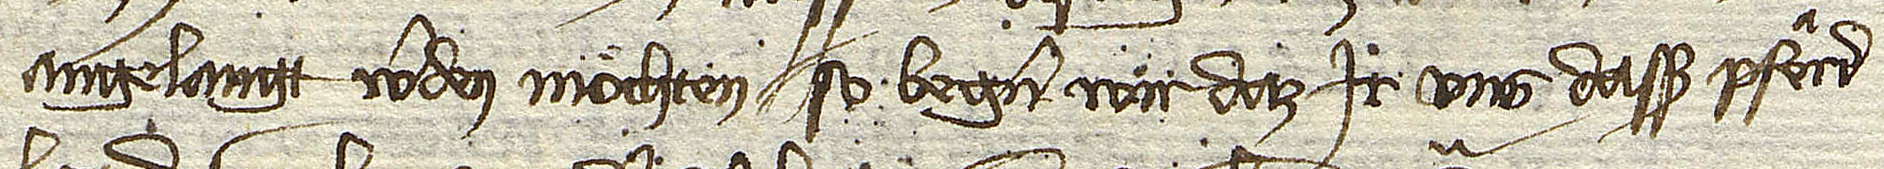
angelangt w*den möchten / ſo beg*n wir daʒ Ir vns daſſ* pfërd
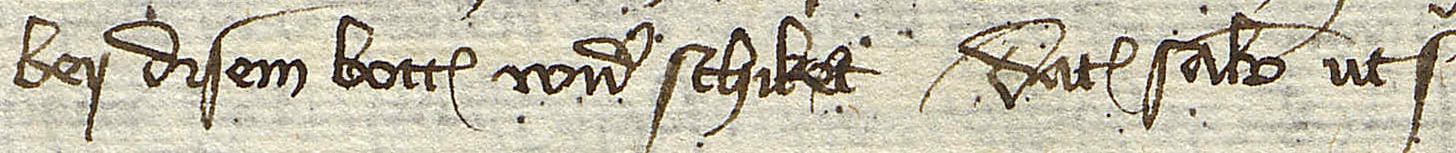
bey diſem bott* wid* ſchiket / Dat* ſabo* ut ſ*
